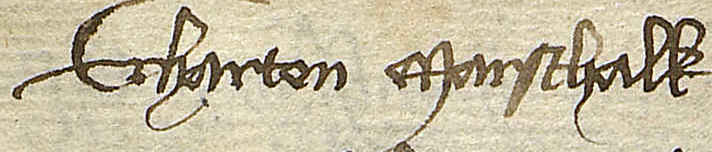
Erharten Marſchalk
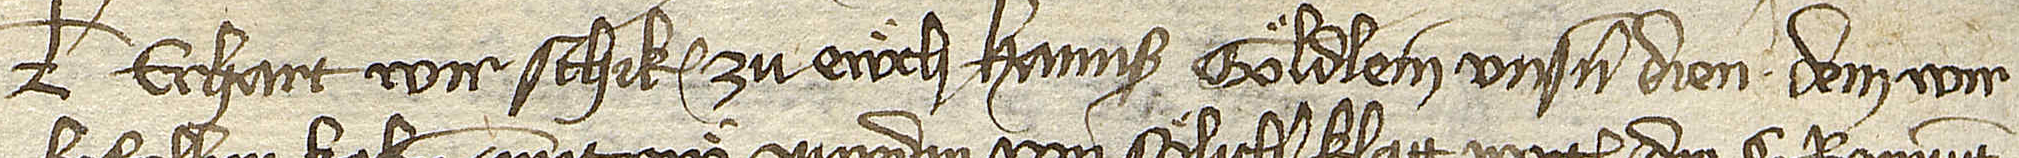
L* Erhart wir ſchik* ʒu eẅch Hannſ* Göldlein vnſn* dien* . dem wir
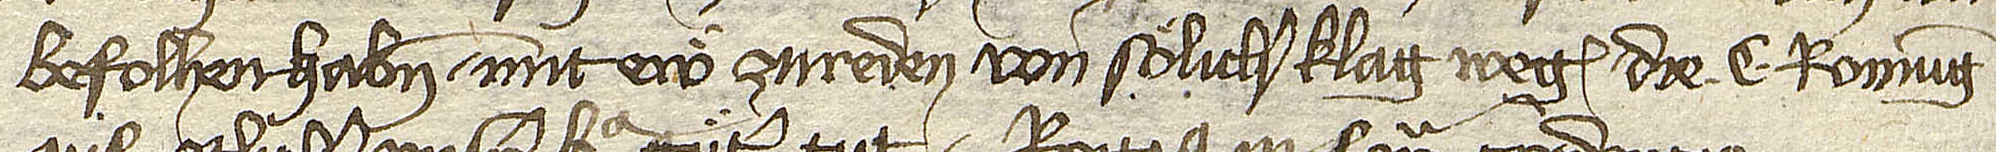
befolhen habn* / mit eẅ ʒureden von ſölich* klag weg* / die . C* . Romu*g
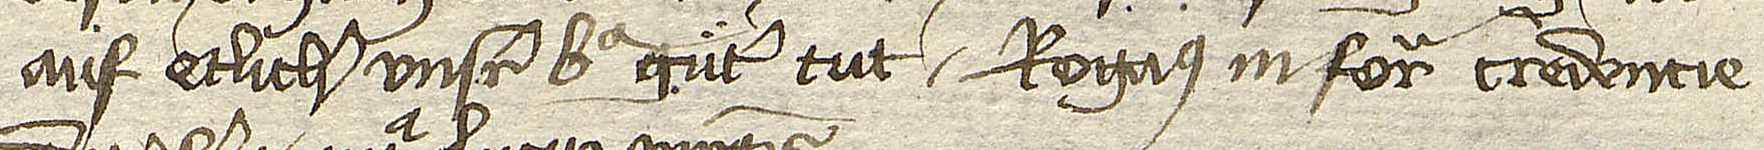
auf etlich* vnſr* b* güt* tut / Roga* in for* credencie
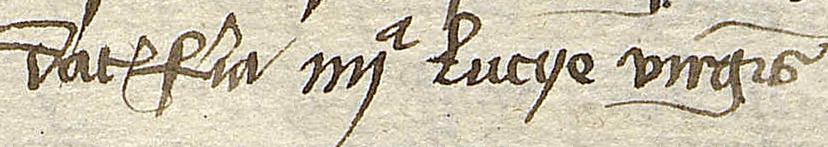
Dat* fi*a iiii* Lucye virg*is
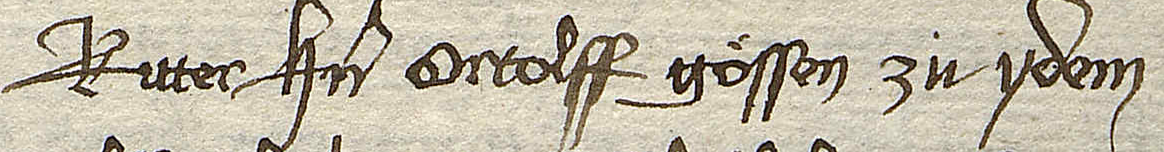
Ritter Hn* Ortolff göſſen ʒu ydem
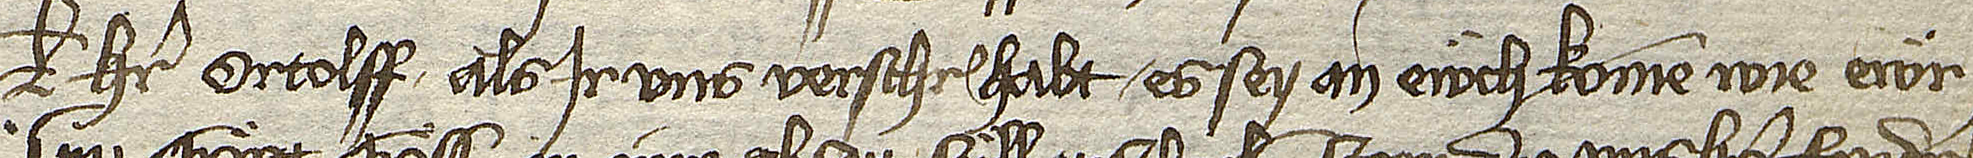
L* hr* Ortolff / als Ir vns verſchr* habt / es ſey an eẅch kome* wie eẅr
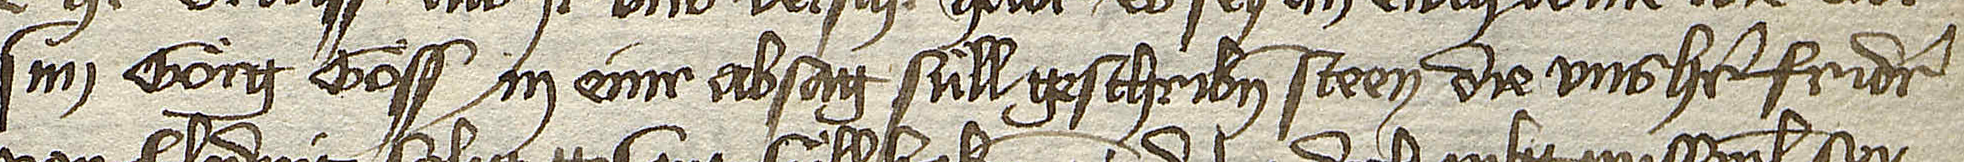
ſun Görg Göſſ in einr abſag ſüll geſchribn* ſteen die vns hr* fridr*
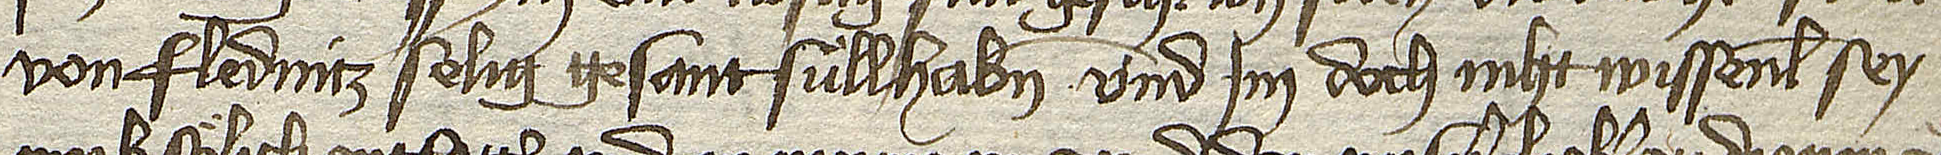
von flednicʒ ſelig geſant ſüll habn* vnd Im doch niht wiſſenl* ſey
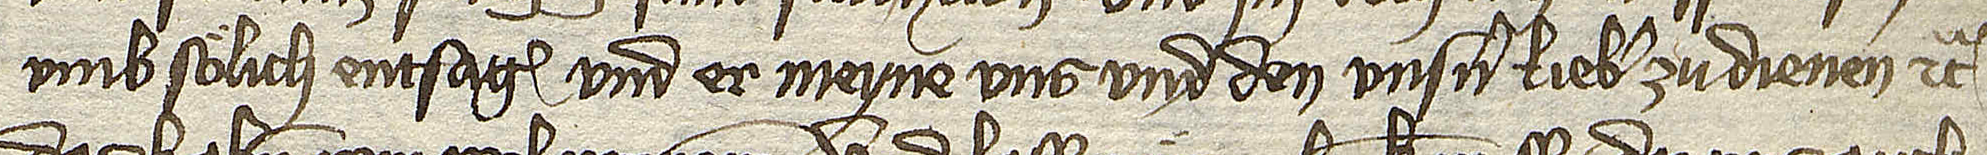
vmb ſölich entſag* vnd er meyne vns vnd den vnſn* lieb* ʒu dienen ec*
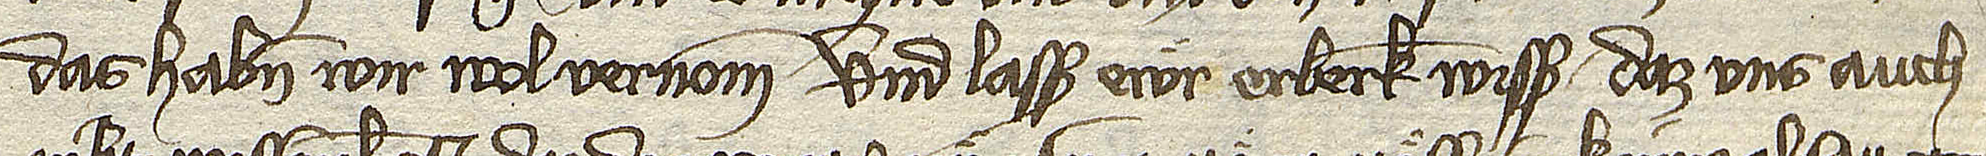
Das habn* wir wol vernom* Vnd laſſ* eẅr erberk* wiſſ* / daʒ vns auch
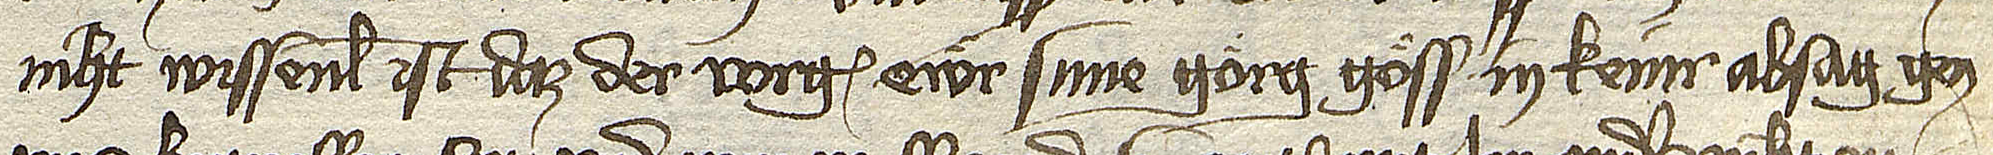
niht wiſſenl* iſt daʒ der vorg* eẅr ſune görg göſſ in keinr abſag gen
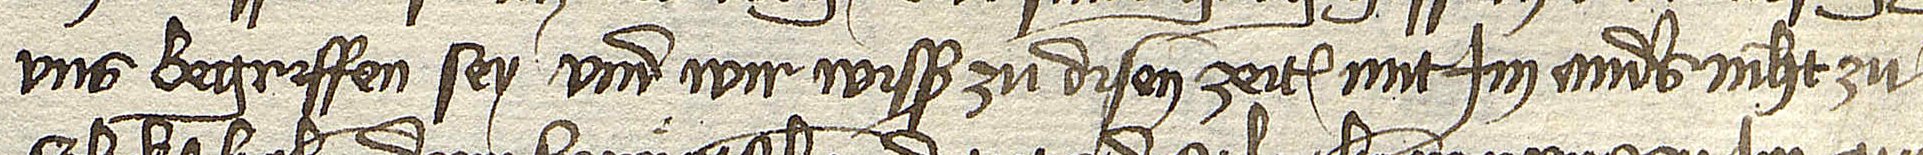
vns begriffen ſey vnd wir wiſſ* ʒu diſen ʒeit* mit Im and*s niht ʒu
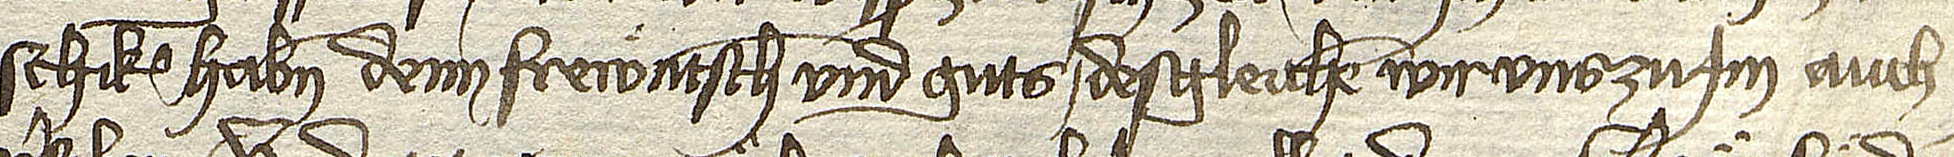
ſchik* habn* denn freẅntſch* vnd guts / geſgleiche* wir vns ʒu Im auch
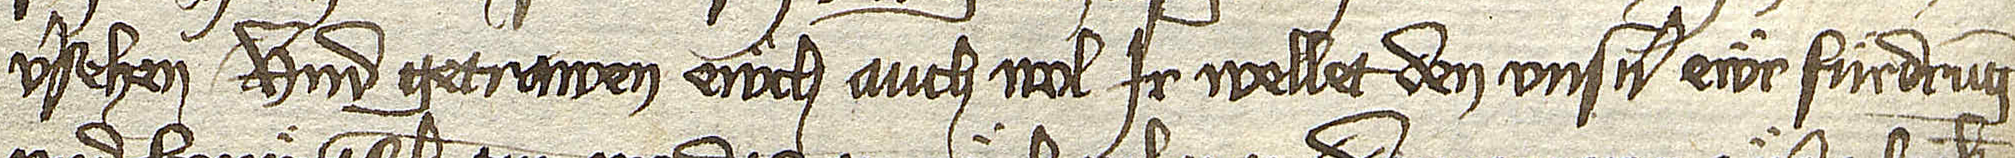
v*ſehen / Vnd getrawen eẅch auch wol Ir wellet den vnſn* eẅr fürdru*g
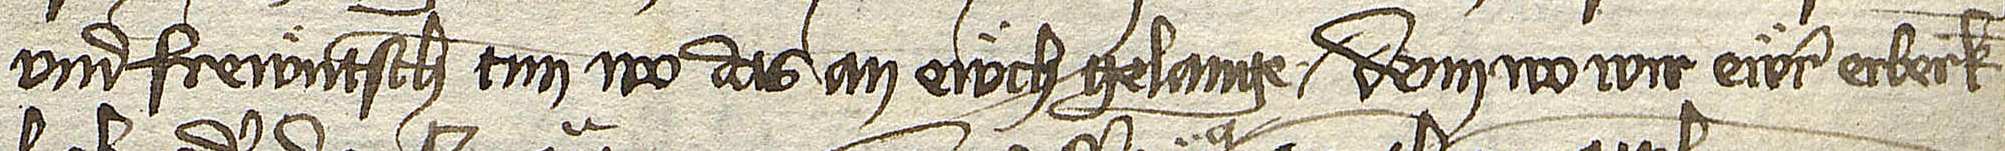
vnd freẅntſch* tun wo das an eẅch gelange . / Denn wo wir eẅr* erberk*
